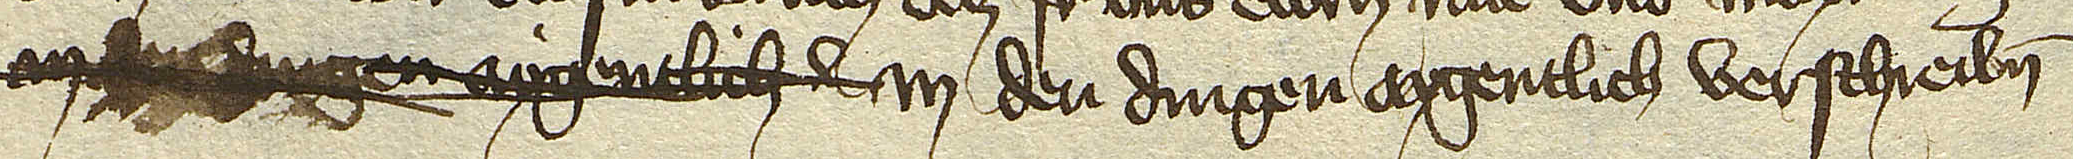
an den dingen aygentlich l in den dingen aygentlich verſchreibn*
